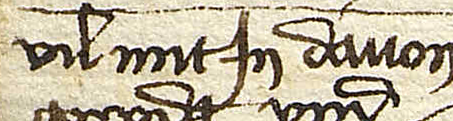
vil mit In dauon
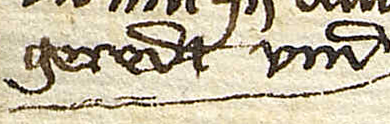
geredt vnd
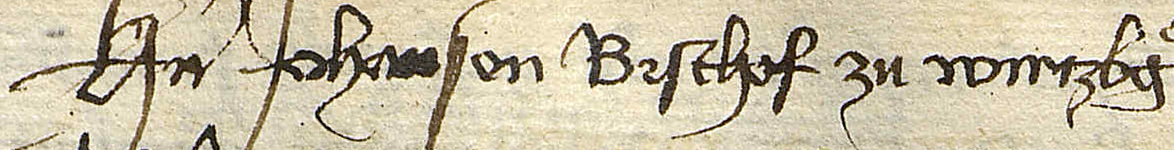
H*n Iohanſen Biſchof ʒu wircʒb*g
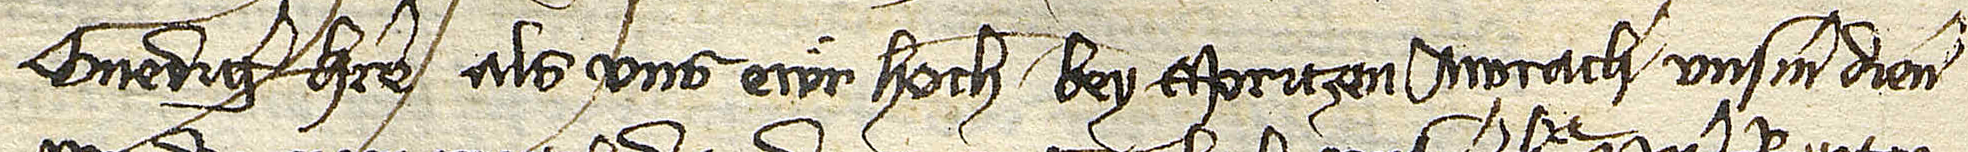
Gnedig* h*re als vns ewr hoch* / bey Moricʒen Awrach* vnſ*m dien*
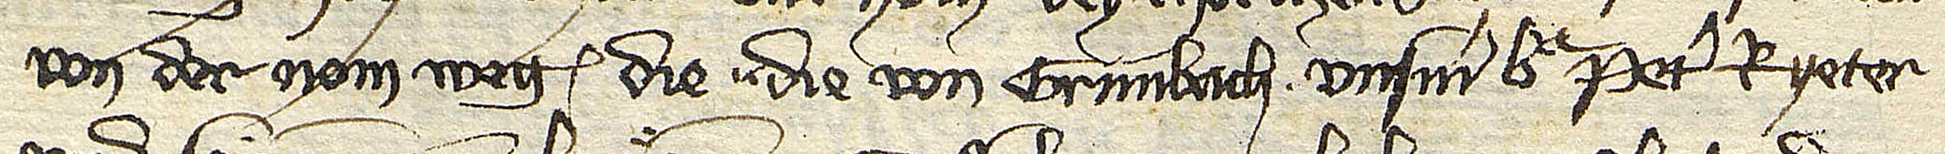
von der nom weg* die ~ die von Grunbach . vnſ*m b* Pet* Ryeter
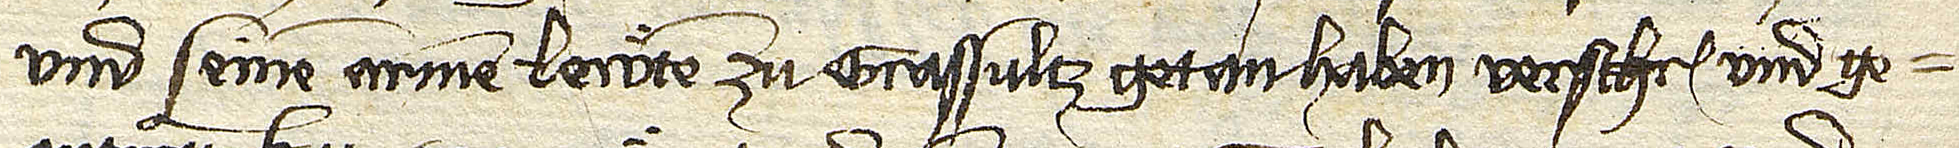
vnd ſeine* arme* lewte* ʒu Graſſulcʒ getan haben verſchr* vnd ge =
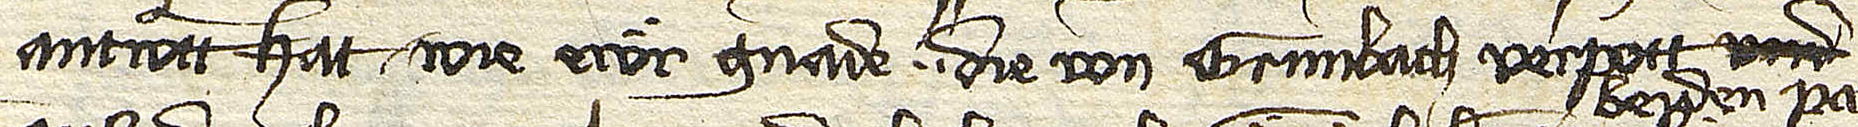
antw*tt hat / wie ewr gnade ~ die von Grunbach verpott vnd
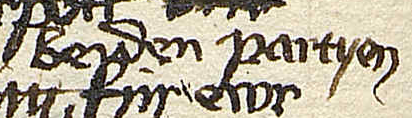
beiden partyen
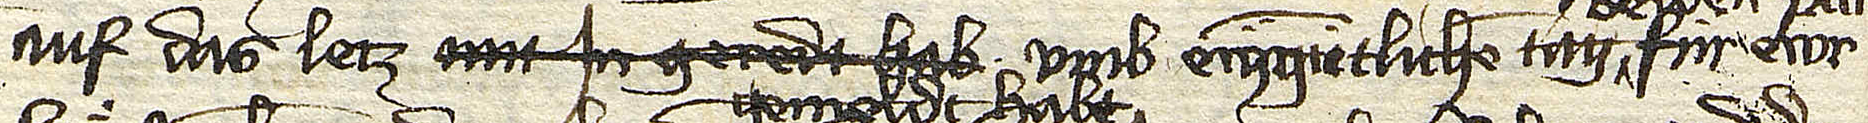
auf das lecʒ mit In geredt hab . vmb ein* gütliche* tag für ewr
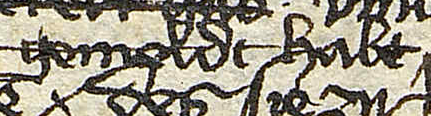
gemeldt habt
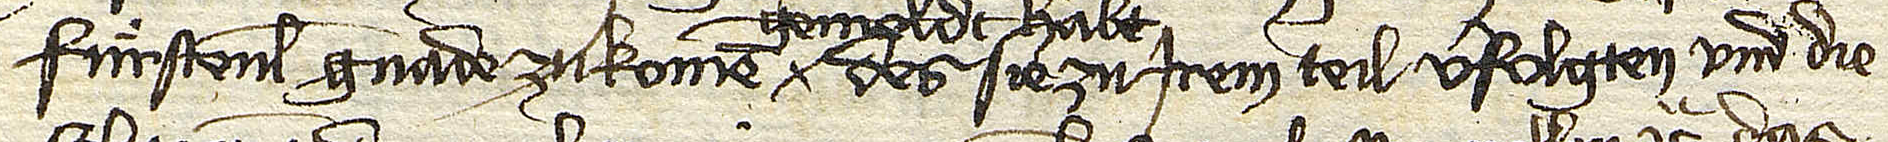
fürſtenl* gnade ʒu kome* des ſie ʒu Irem teil v*folgten vnd die
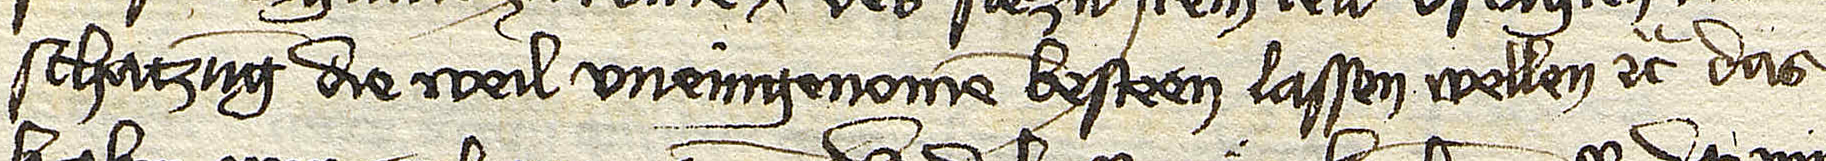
ſchacʒu*g die weil vneingenome* beſteen laſſen wellen ec* das
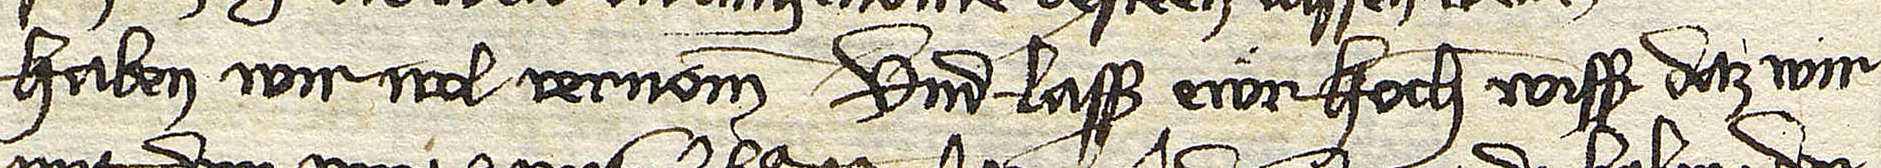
haben wir wol vernom* / Vnd laſſ* ewr hoch* wiſſ* daʒ wir
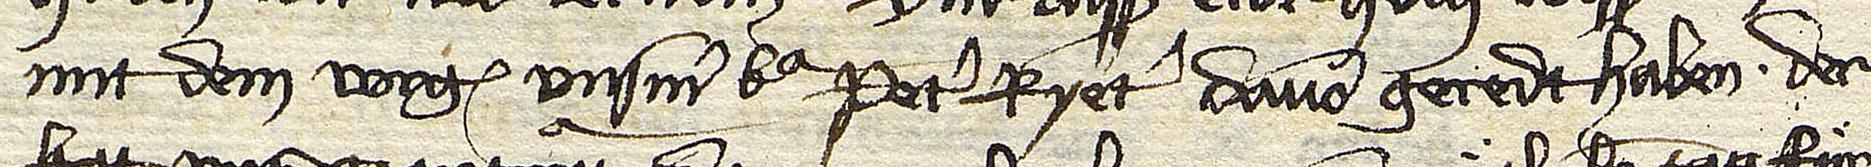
mit dem vorg* vnſ*m b* Pet* Ryet* dauo* geredt haben . Der
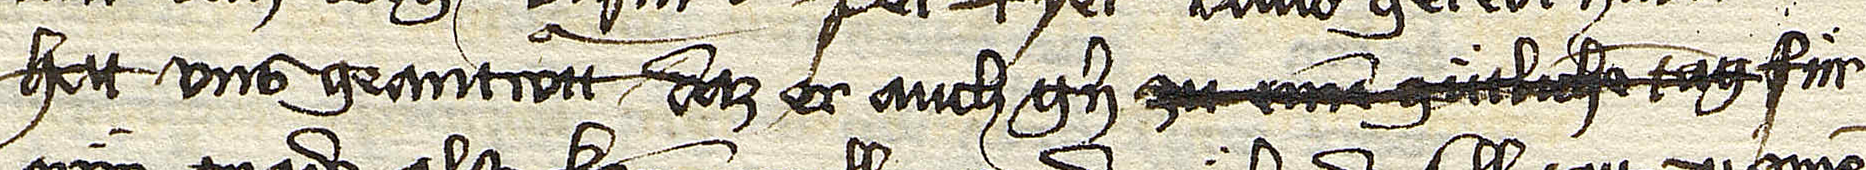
hat vns gewantw*tt / daʒ er dauch g*n ʒu ein* gütliche* tag für
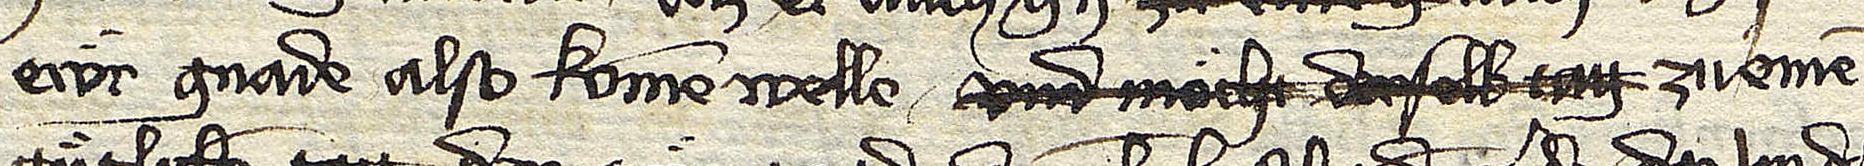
ewr gnade alſo kome* welle / vnd möcht derſelb tag ʒu eine*
